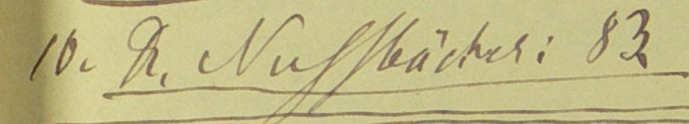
10.) Dr. Nussbächer: 83.
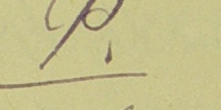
P.
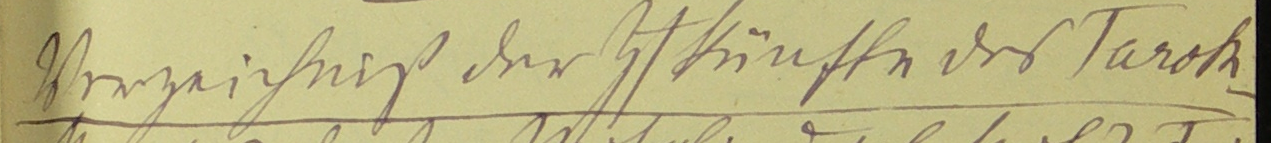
Verzeichniß der Zusammenkünfte des Tarok¬
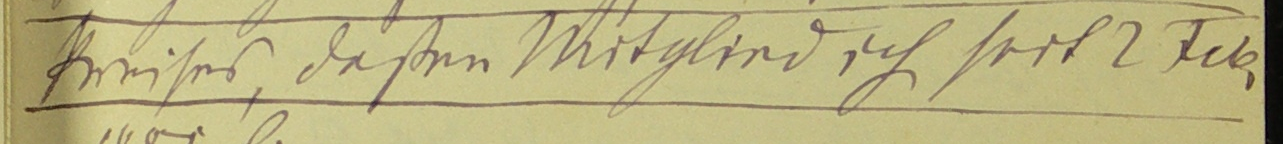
krieses, deßen Mitglied ich seit 2. Febr.
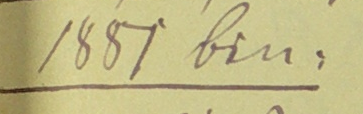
1881 bin:
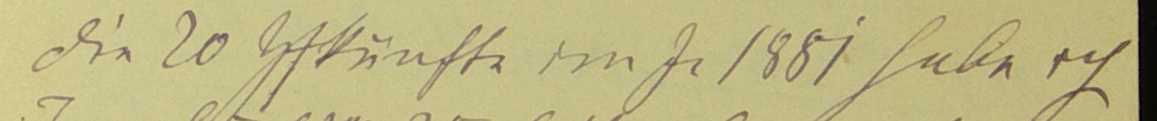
Die 20 Zusammenkünfte im Jahre 1881 habe ich
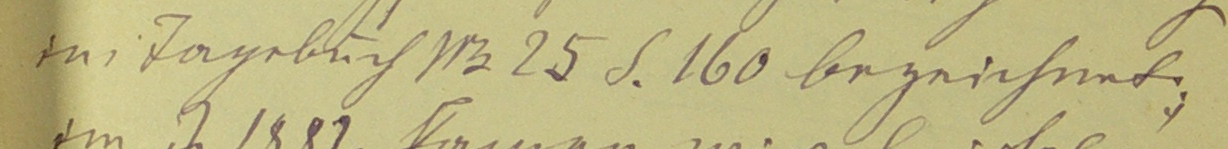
im Tagebuch Nr. 25 S. 160 bezeichnet.
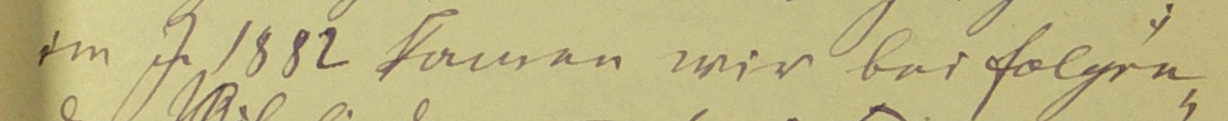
Im Jahre 1882 kamen wir bei folgen¬
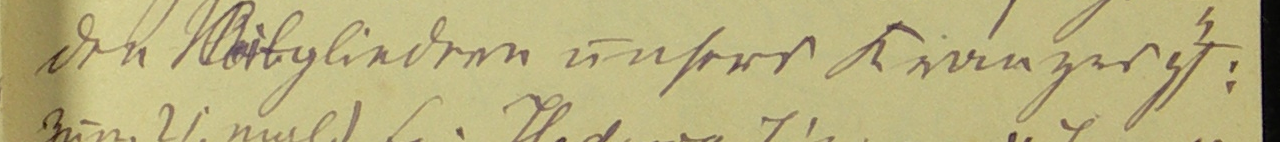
den Mitgliedern unseres Kranzes zusammen:
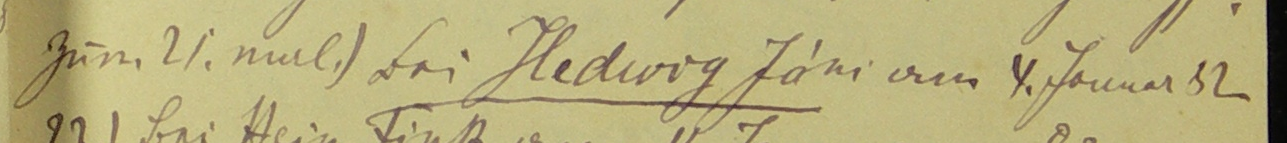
Zum 21.) mal bei Hedwig Jani am 4.Januar 82
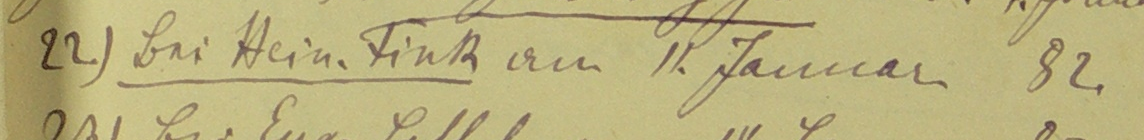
22.) bei Heinr. Fink 11. Januar 82
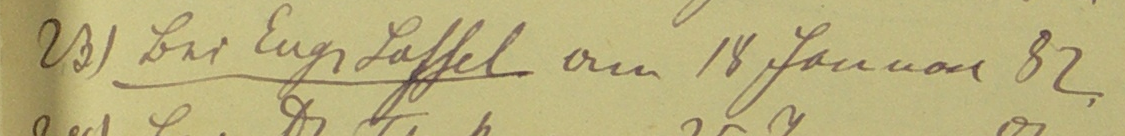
23.) bei Eugen Lassel 18. Januar 82
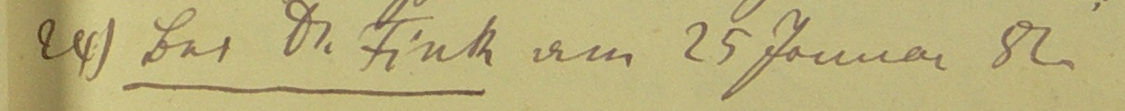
24.) bei Dr. Fink 25. Januar 82
